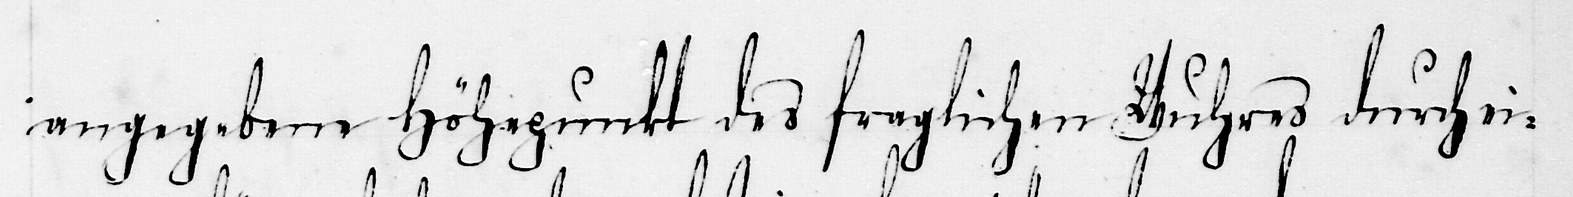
angegebene Höhepunkt des fraglichen Wuhres durch ei¬
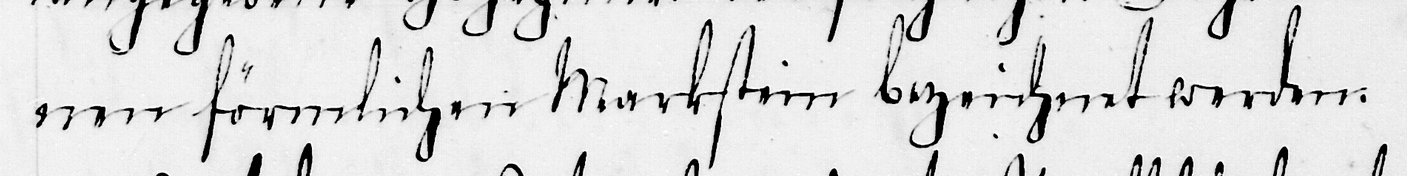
nen förmlichen Markstein bezeichnet werden.
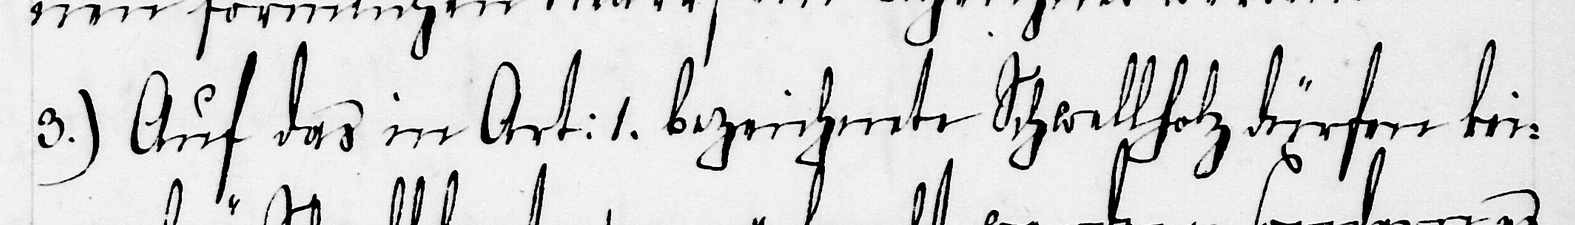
3.) Auf das in Art: 1. bezeichnete Schwellholz dürfen kei¬
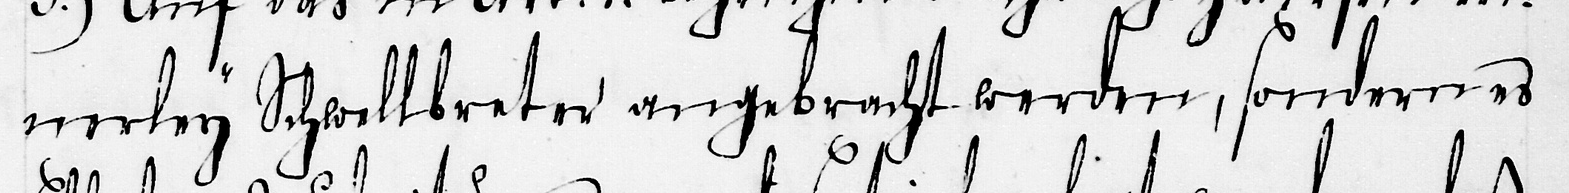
nerley Schwellbreter angebracht werden, sondern es
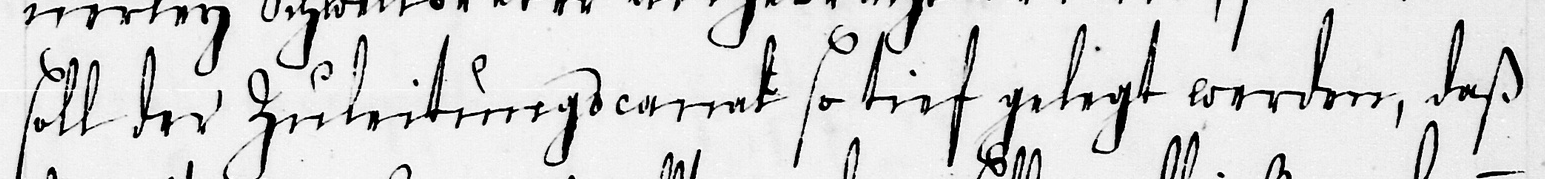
soll der Zuleitungscanal so tief gelegt werden, daß
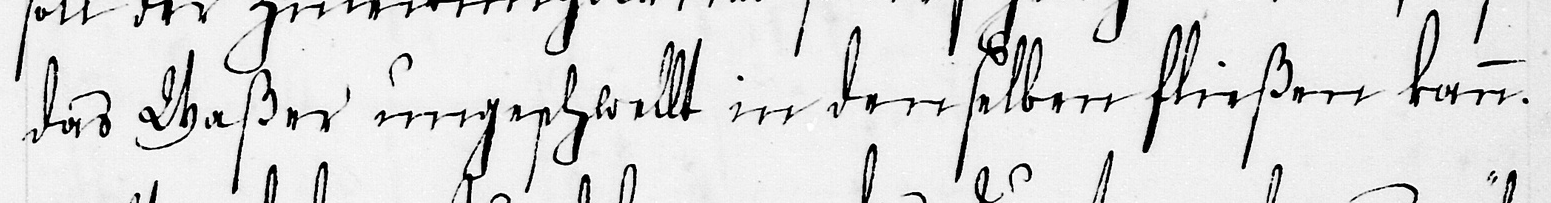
das Waßer ungeschwellt in denselben fließen kann.
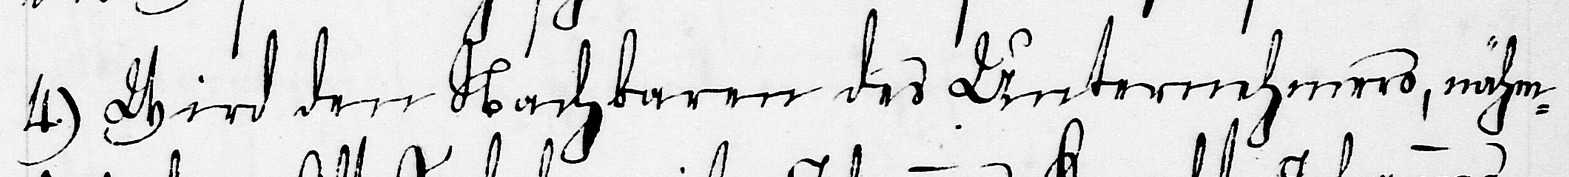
4.) Wird den Nachbaren des Unternehmers, nähm¬
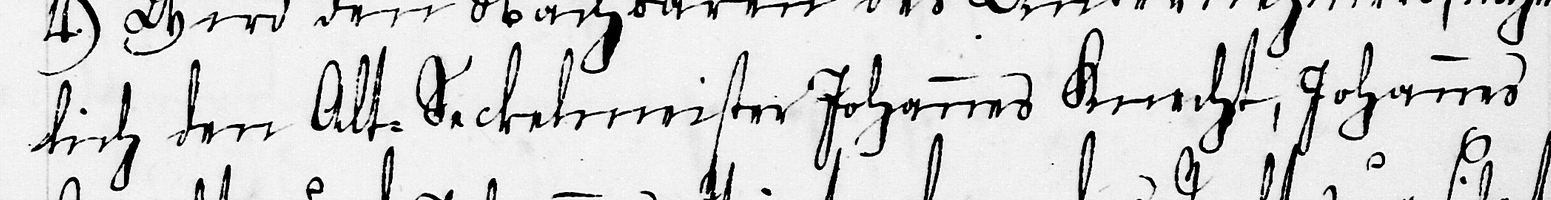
lich den Alt-Seckelmeister Johannes Knecht, Johannes
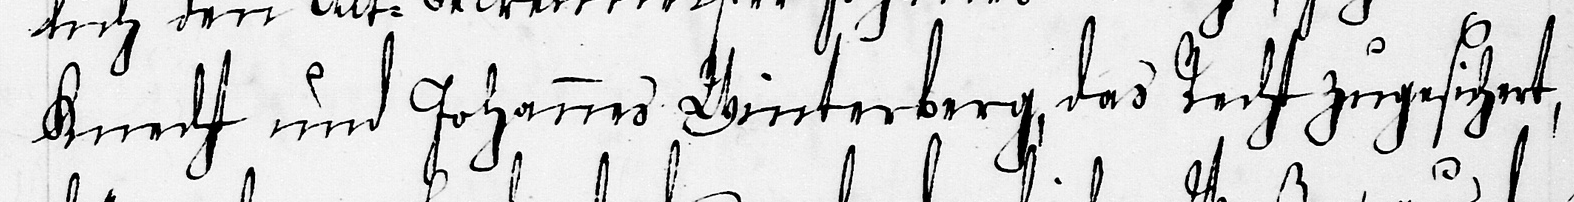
Knecht und Johannes Winterberg, das Recht zugesiche¬
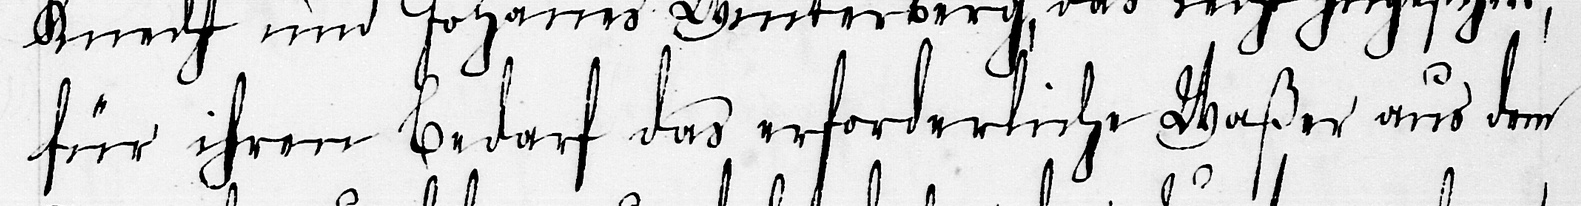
für ihren Bedarf das erforderliche Waßer aus dem
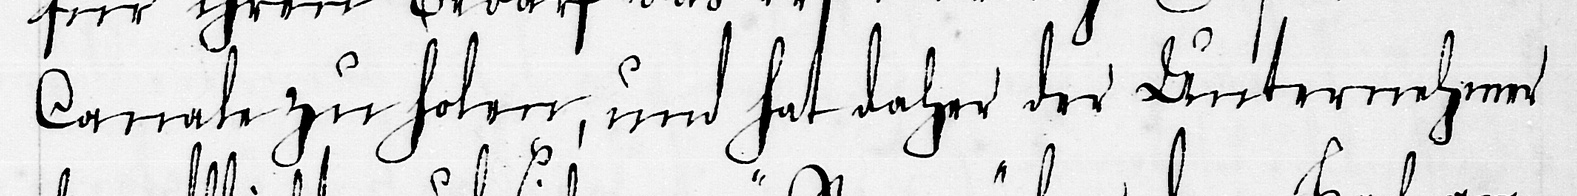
Canale zu holen, und hat daher der Unternehmer
